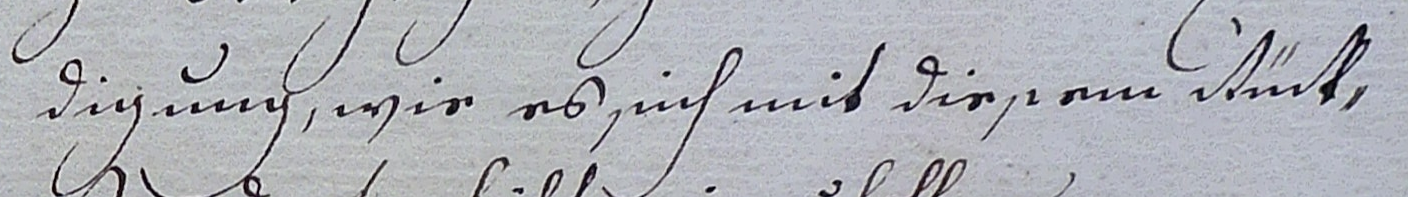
digung, wie es sich mit diesem Rück¬
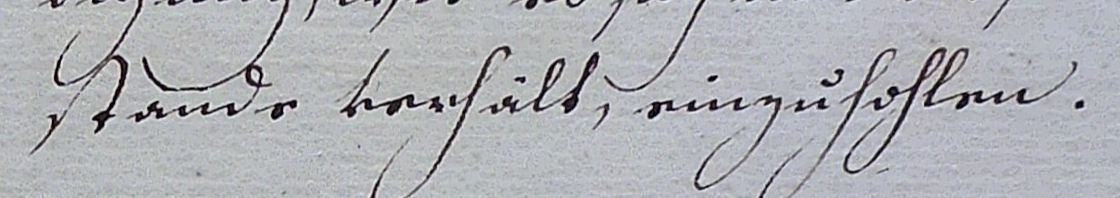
stande verhält einzuhohlen.
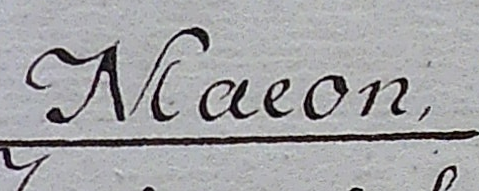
Maeon,
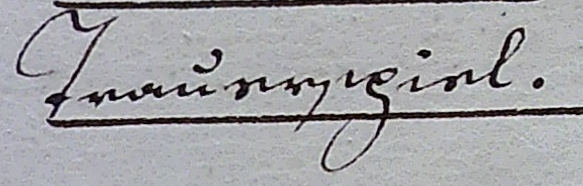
Trauerspiel.
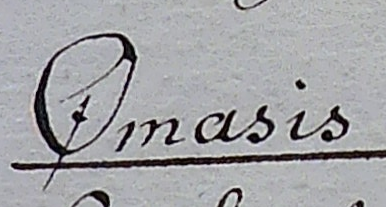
Omasis
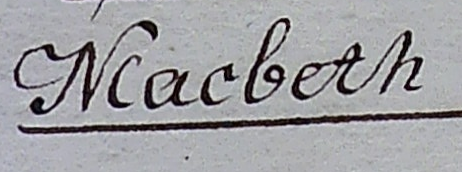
Macbeth
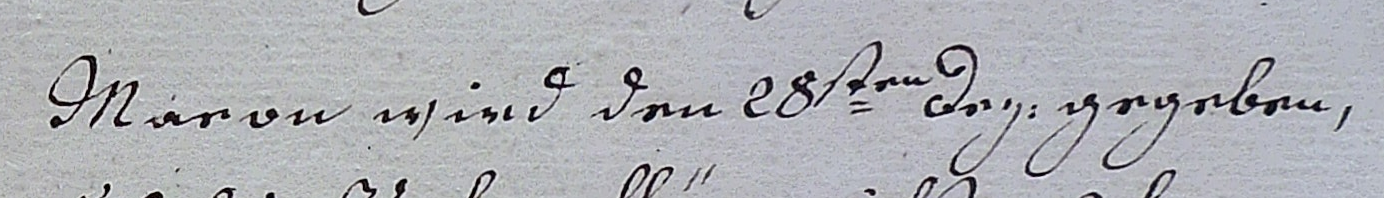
Maeon wird den 28ste͇n Dez. gegeben,
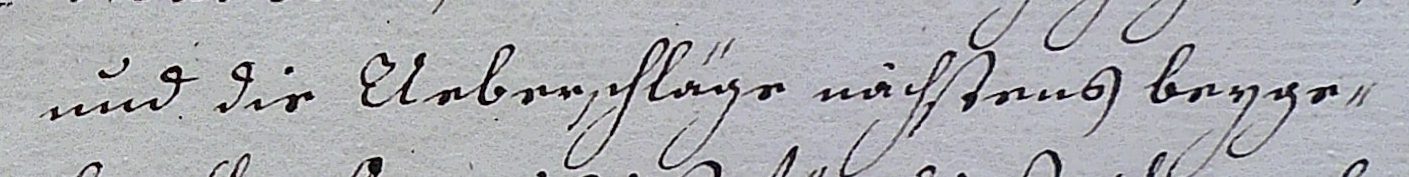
und die Ueberschläge nächstens beyge¬
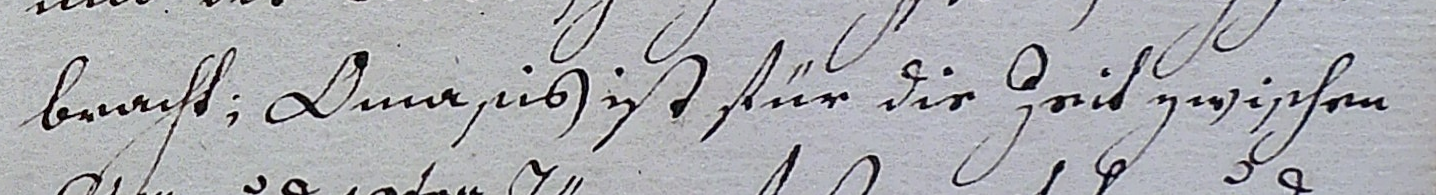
bracht; Omasis ist für die Zeit zwischen
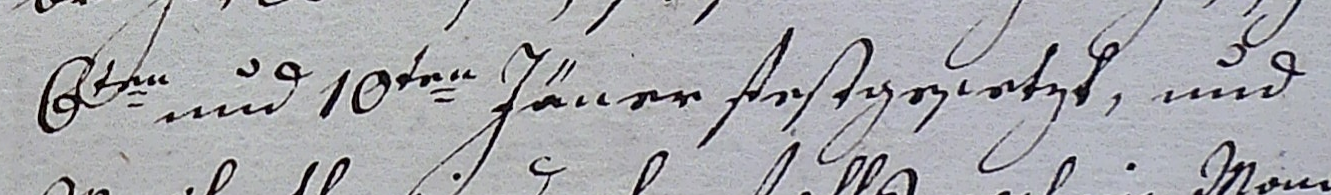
6te͇n und 10te͇n Jäner festgesetzt, und
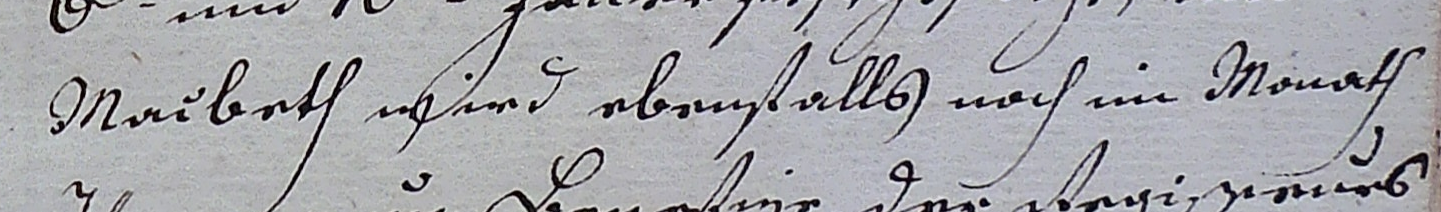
Macbeth wird ebenfalls nach im Monath
